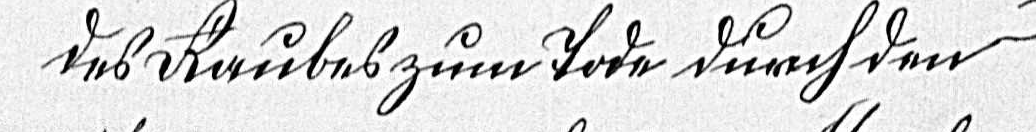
des Raubes zum Tode durch den
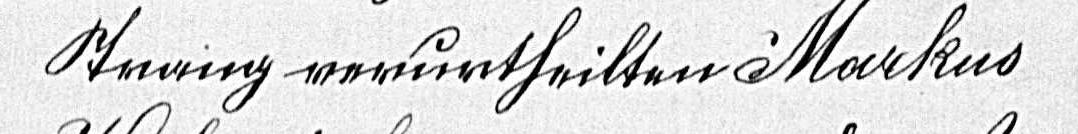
Strang verurtheilten Markus
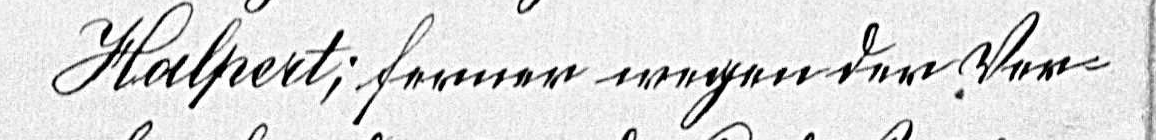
Halpert; ferner wegen der Ver¬
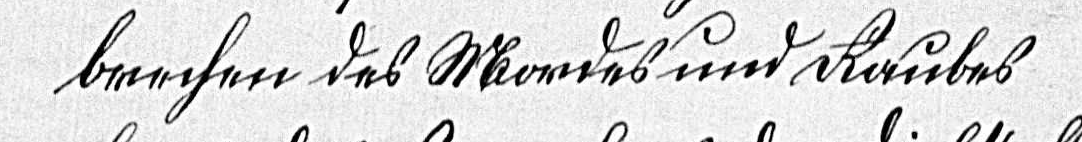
brechen des Mordes und Raubes
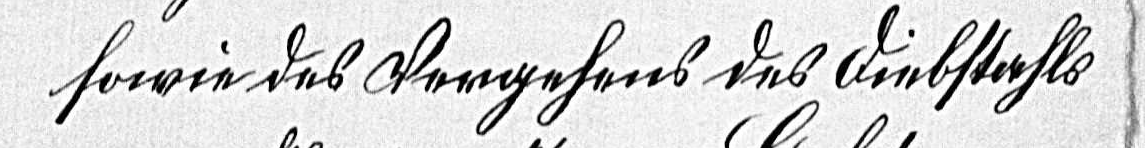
sowie des Vergehens des Diebstahls
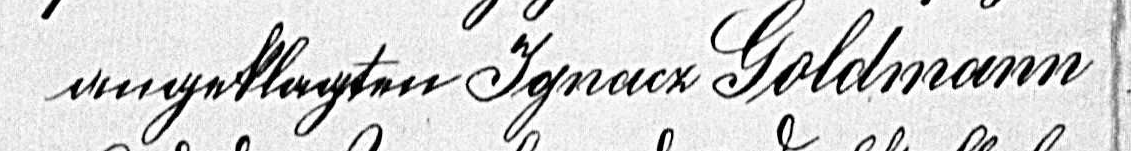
angeklagten Jgnacz Goldmann
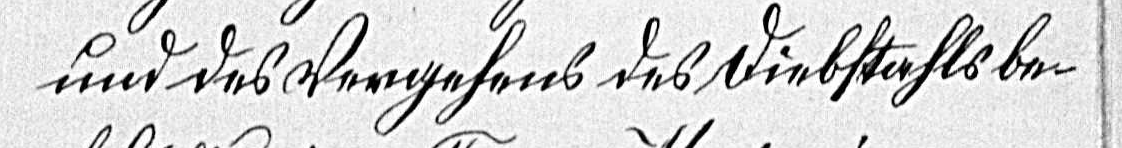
und des Vergehens des Diebstahls be¬
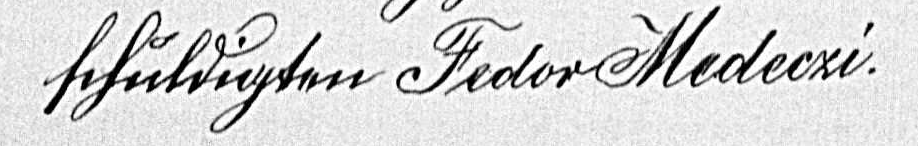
schuldigten Fedor Medeczi.
